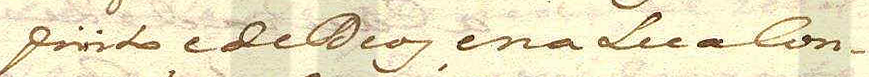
pirito e de Deos, e na Sua Con
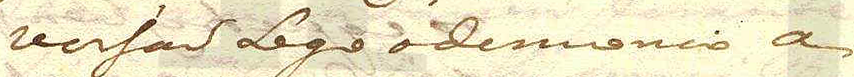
versaõ logo o demonio a
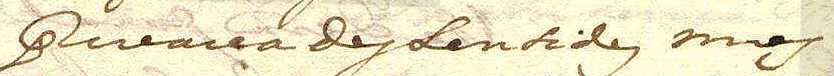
privava dos sentidos mos
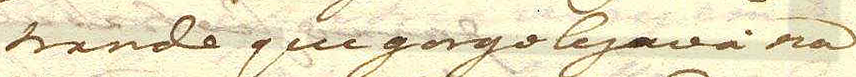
trando que gorgolejava na
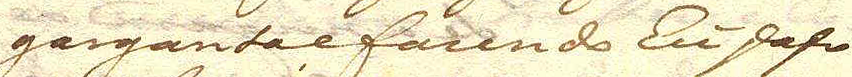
garganta, e fazendo hū paso
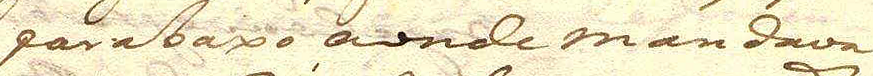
para baxo, aonde mandava
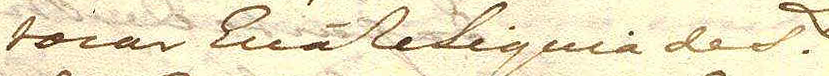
tocar huā Reliquia do S.to
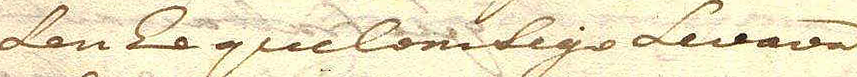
Lenho que comsigo Levava
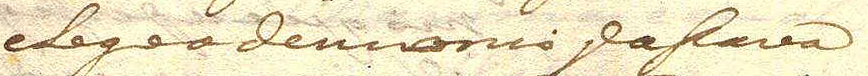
e Logo o demonio passava
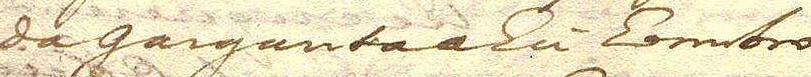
da garganta a hū hombro
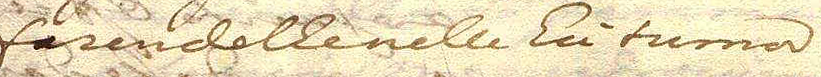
fazendolhe nelle hū tumor
